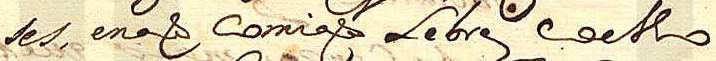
ses, e naõ comiaõ Lebre coelho
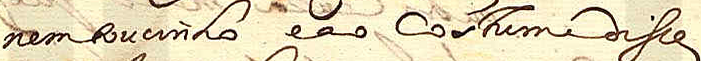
nem toucinho e ao costume disse
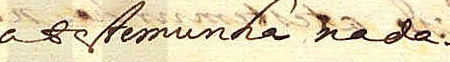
a testemunha nada.
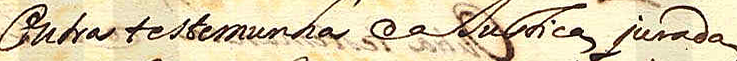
Outra testemunha da Iustica jurada
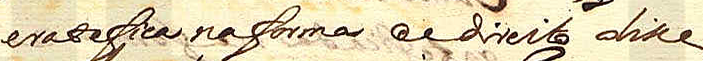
e rateficada na forma de direito disse
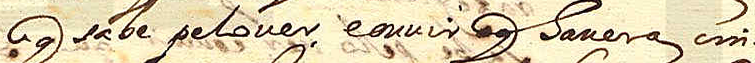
q̄ sabe pelo uer, e ouuir q̄ hauera cin
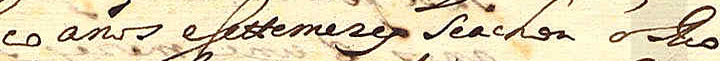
co anos e sette mezes se achou o Reo
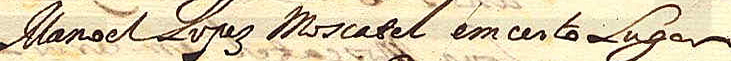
Manoel Lopez Moscatel em certo Lugar
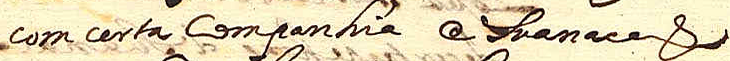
com certa companhia de Sua nacaõ
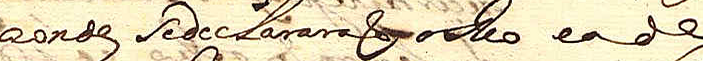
aonde se decLararaõ o Reo e a da
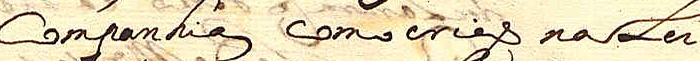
Companhia como criaõ na Lei
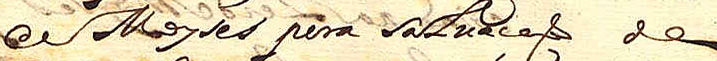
de Moyses per saluaçaõ de
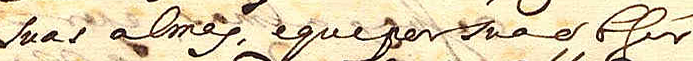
Suas almas, e que por sua obser
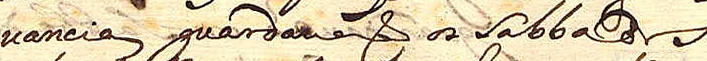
uançia guardauaõ os Sabbados
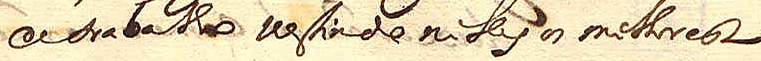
de trabalho uestindo neles os melhores
